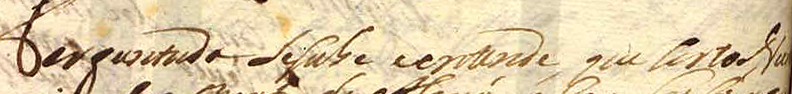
Perguntada se sabe e entende, que certo Nun
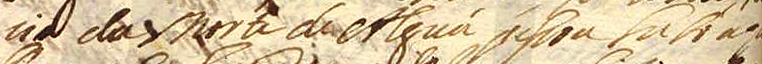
cio da morte de Alguā pessoa he so aqu
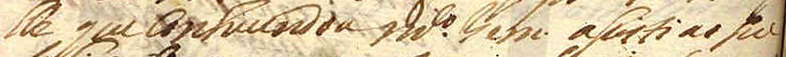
lle que conhecendoa m.to bem asisti ao seu
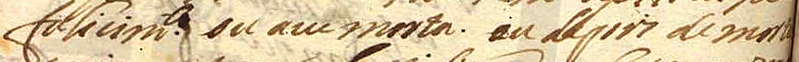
falecim.to, ou a ue morta. ou depois de morta
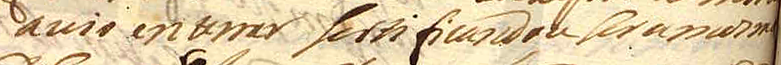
a uio enterrar sertificandose ser a mesm
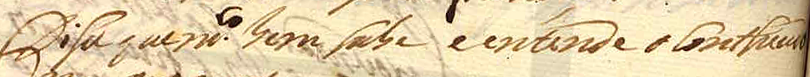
Dise que m.to bem sabe e entende o Contheud
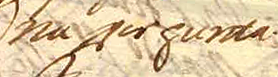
na pergunta
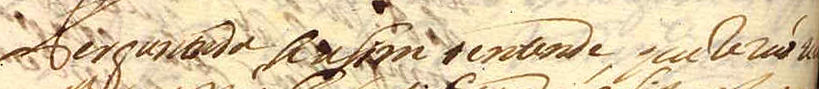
Perguntada se asim o entende, que Rezaõ te
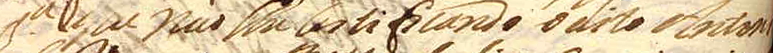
p.a que naõ lhe certificando o dito Anton
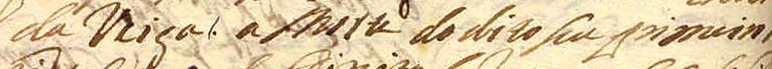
da Veiga a morte do dito seu primeiro
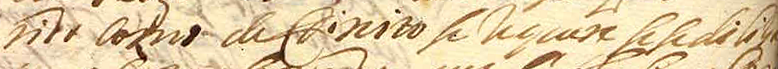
rido como de Direito se Requere se se dili
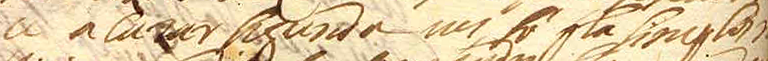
ce a cazar segunda ues só pla Simples n
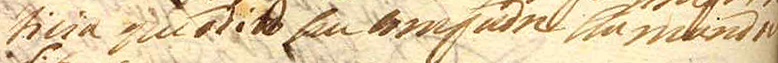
ticia que o dito seu compadre lhe mandou
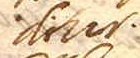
dizer.
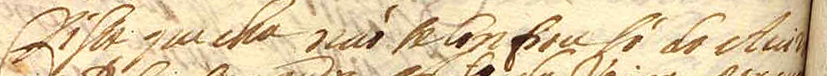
Disse que ella naõ se Confiou só do Auiz
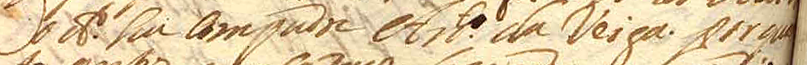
o d̄.o seu compadre Ant.o da Veiga porqu
